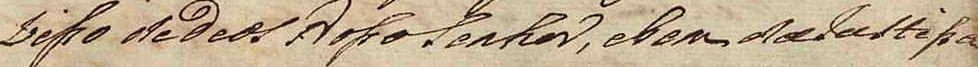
visso de deos Nosso Senhor, e bem da Iustissa
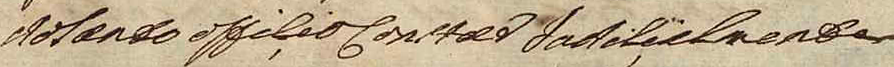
do Santo offiçio Constar JudiçiaLmente
